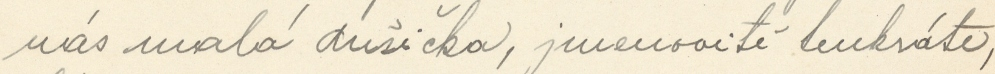nás malá dušička, jmenovitě tenkráte,
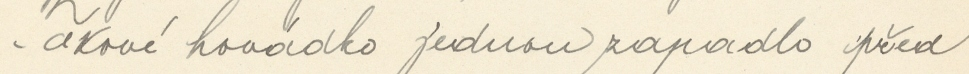Takové hovádko jednou zapadlo před
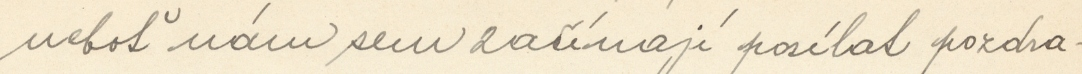neboť nám sem začínají posílat pozdra-
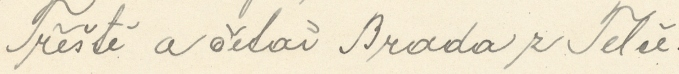Třeště a četař Brada z Telče.
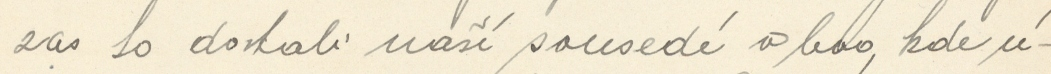zas to dostali naší sousedé v levo, kde ú-
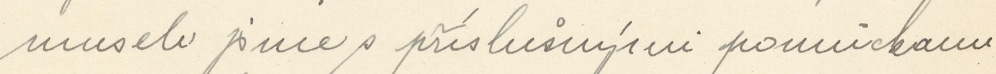museli jsme s příslušnými pomůckami
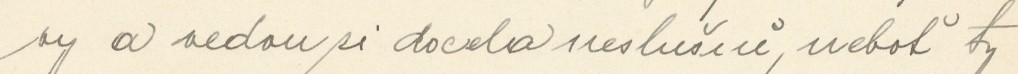vy a vedou si docela neslušně, neboť ty
